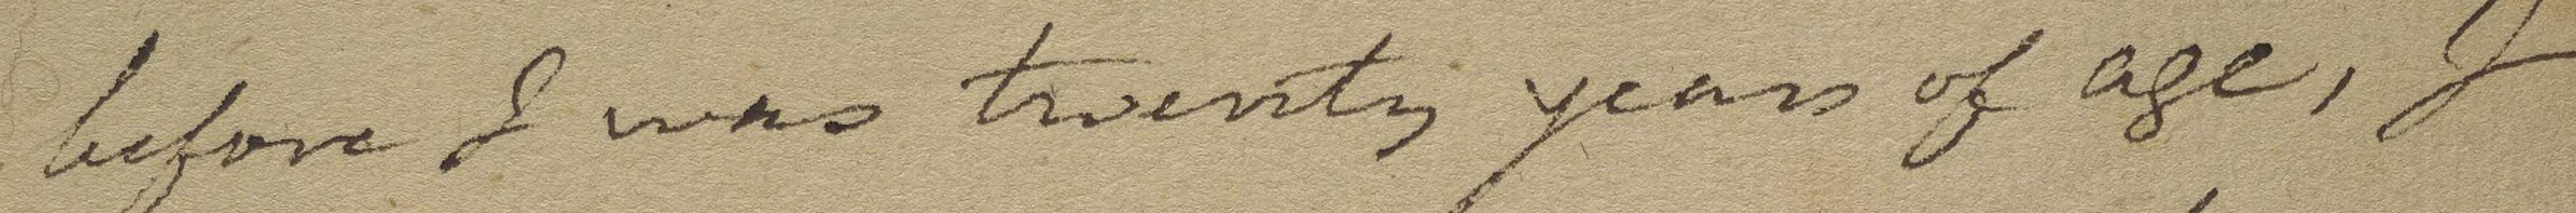before I was twenty years of age, I
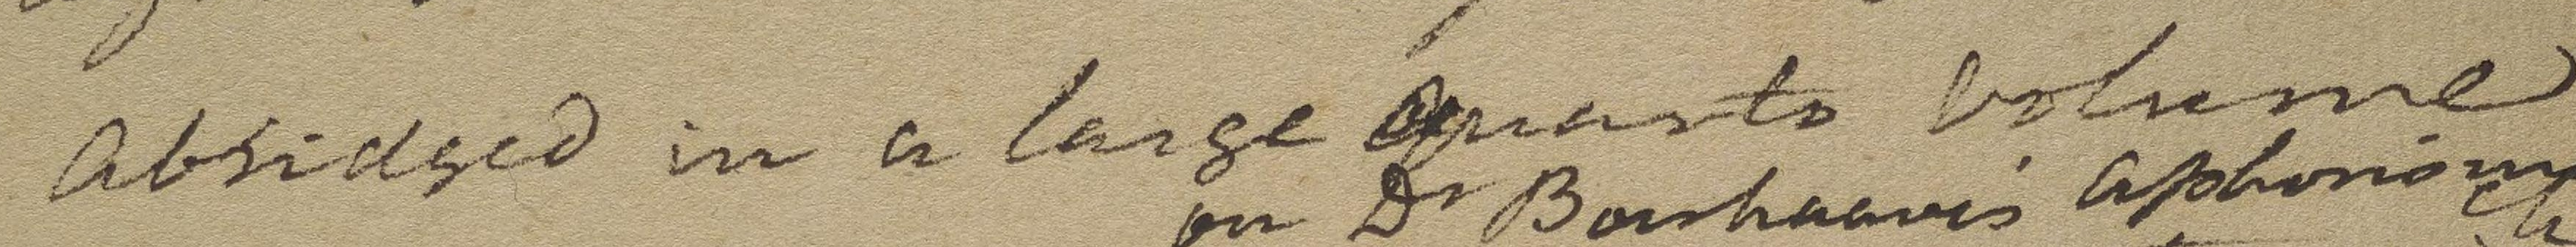abridged in a large quarto volume
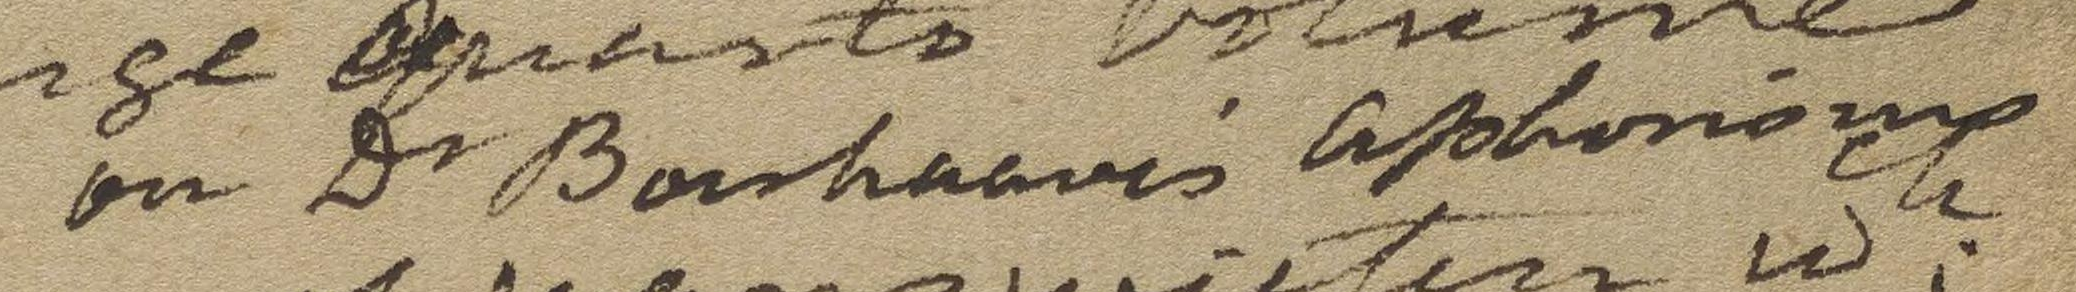on D^r Boerhaave's aphorisms
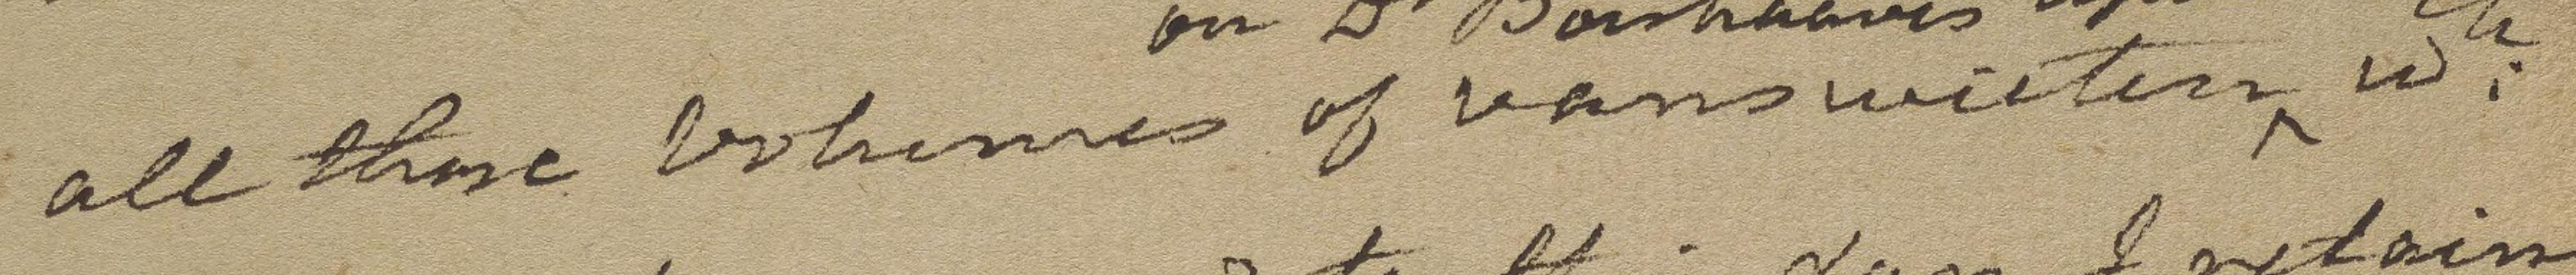all the volumes of Vanswister ^ w^h:
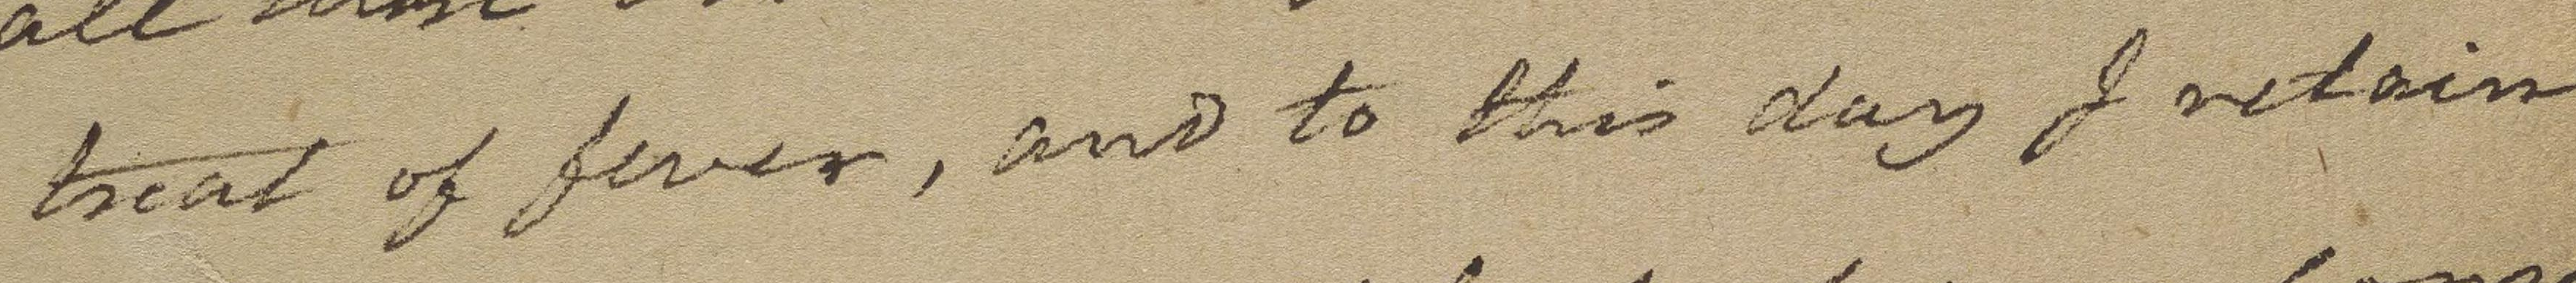treat of fever, and to this day I retain
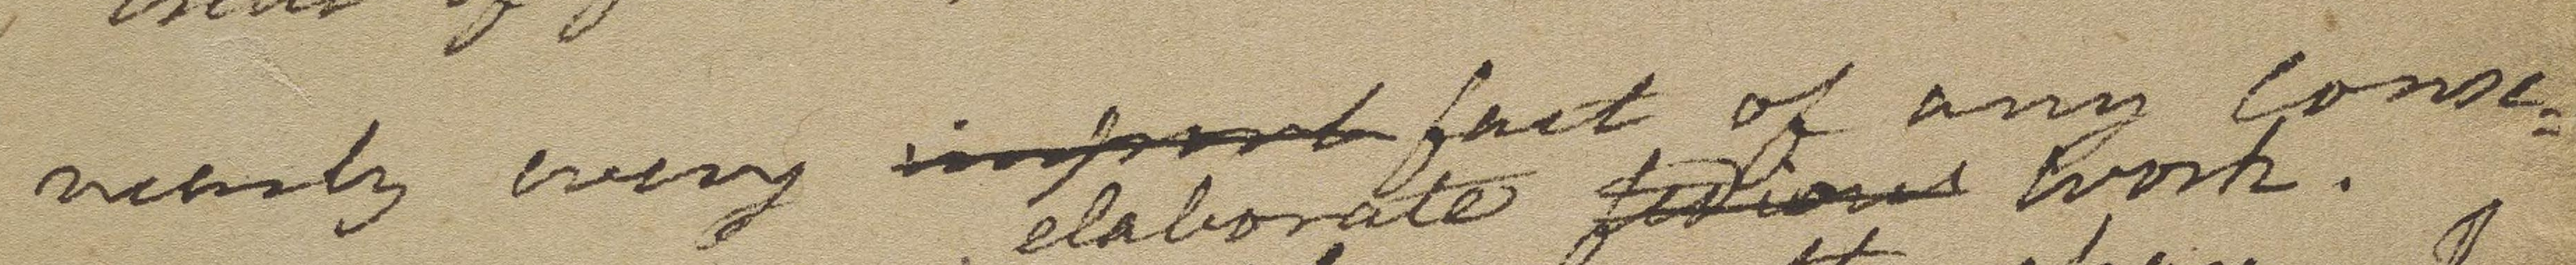nearly every [import] fact of any conse-
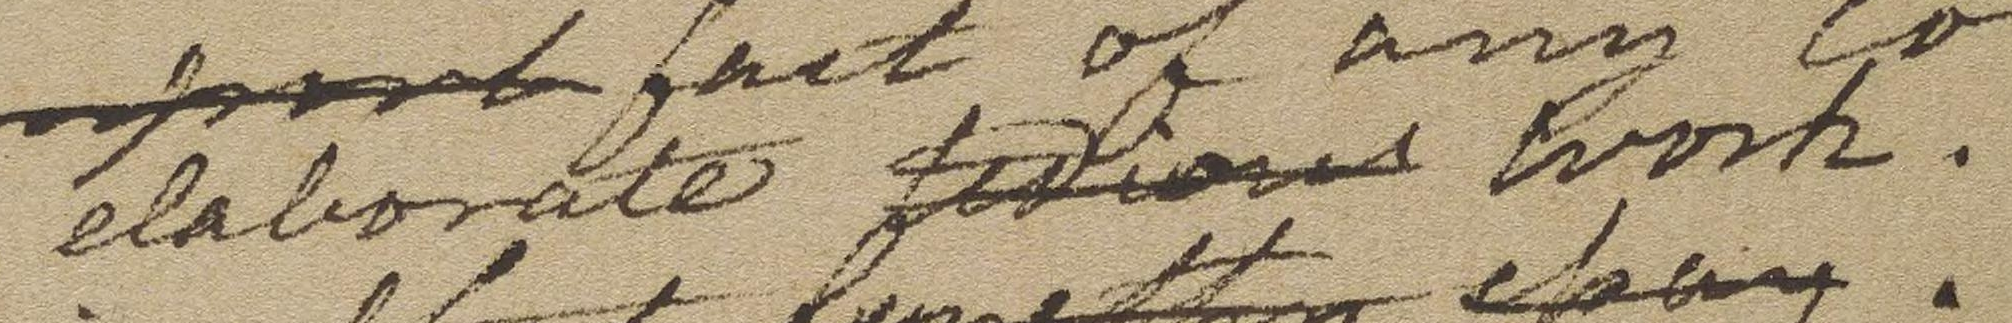elaborate [tedious] work.
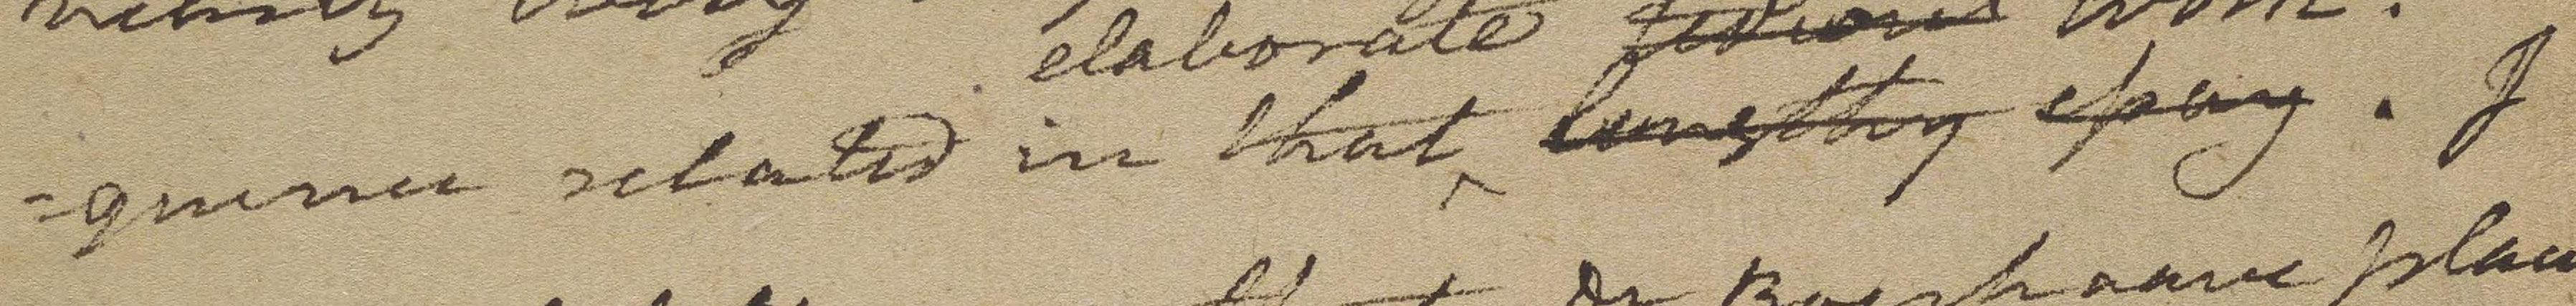-quence related in that ^ [lengthy] [essay]. I
